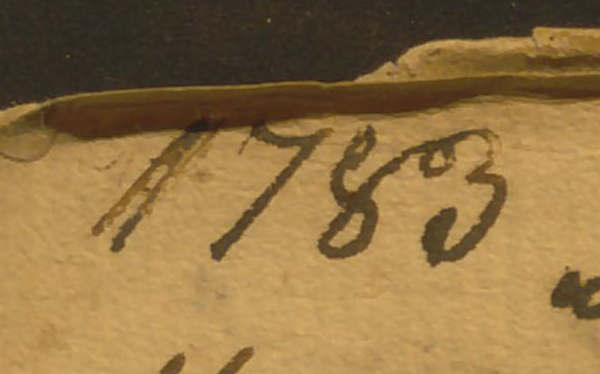1783
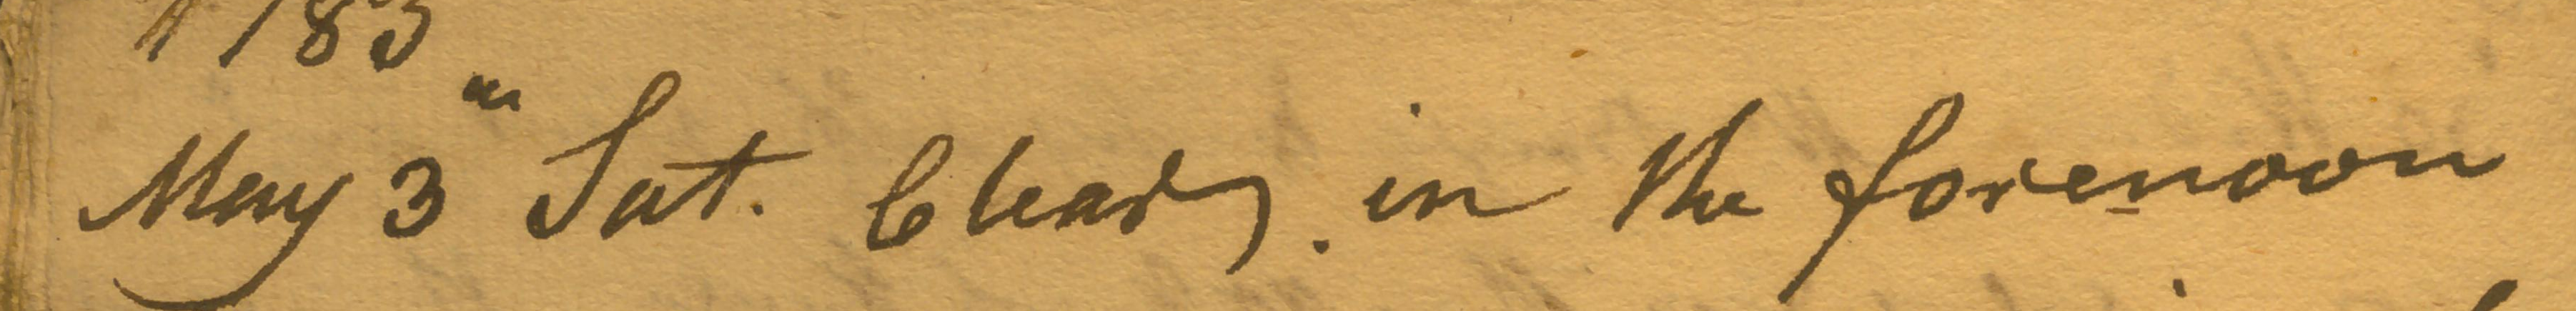May 3^th Sat. Clear in the forenoon
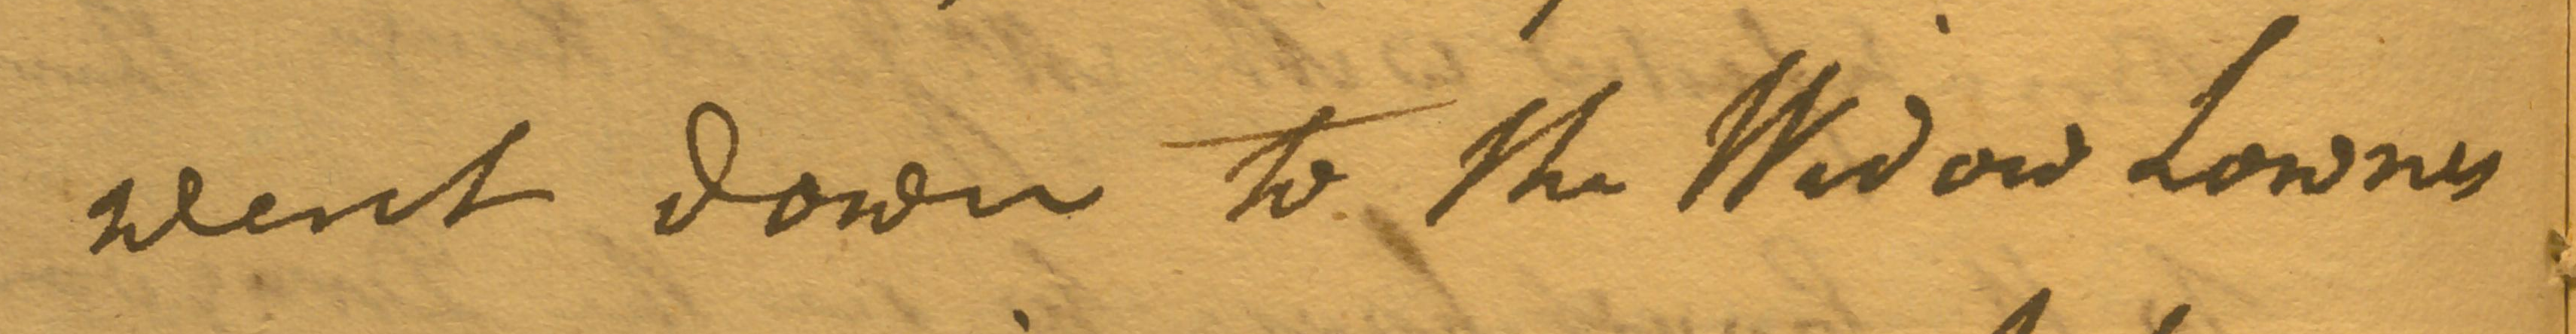went down to the Widow Lownes
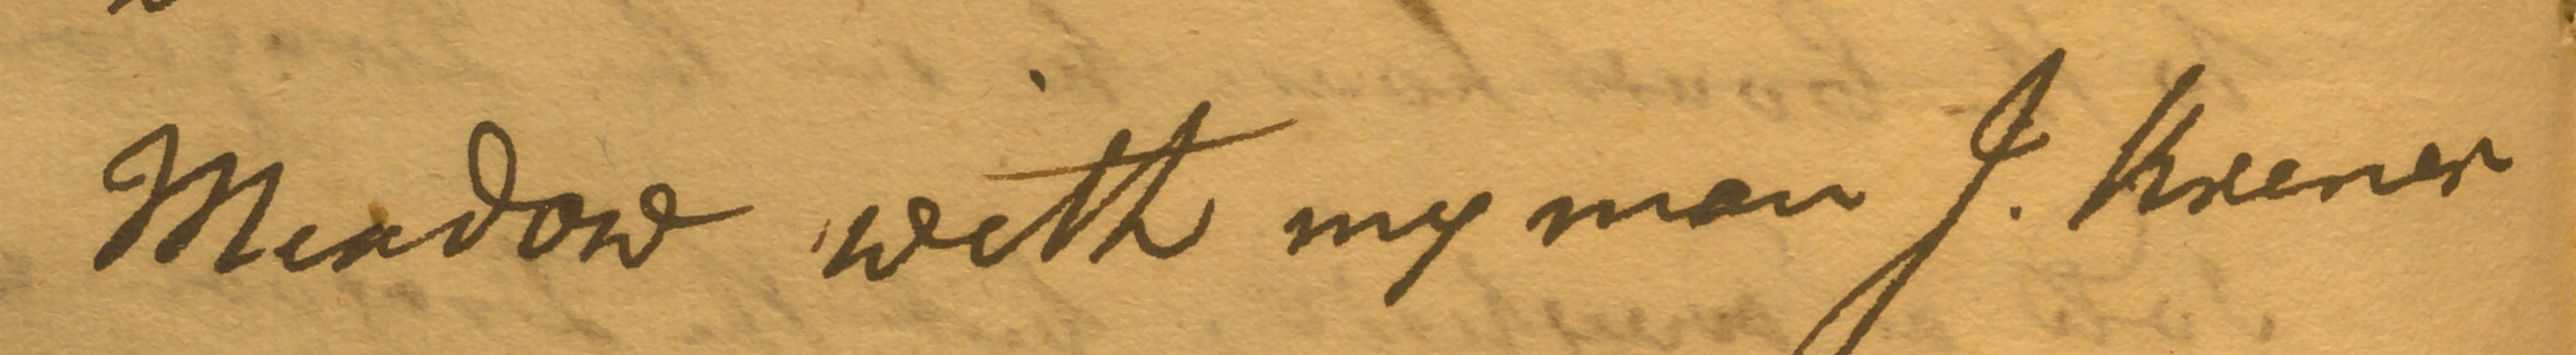Meadow with my man J. krener
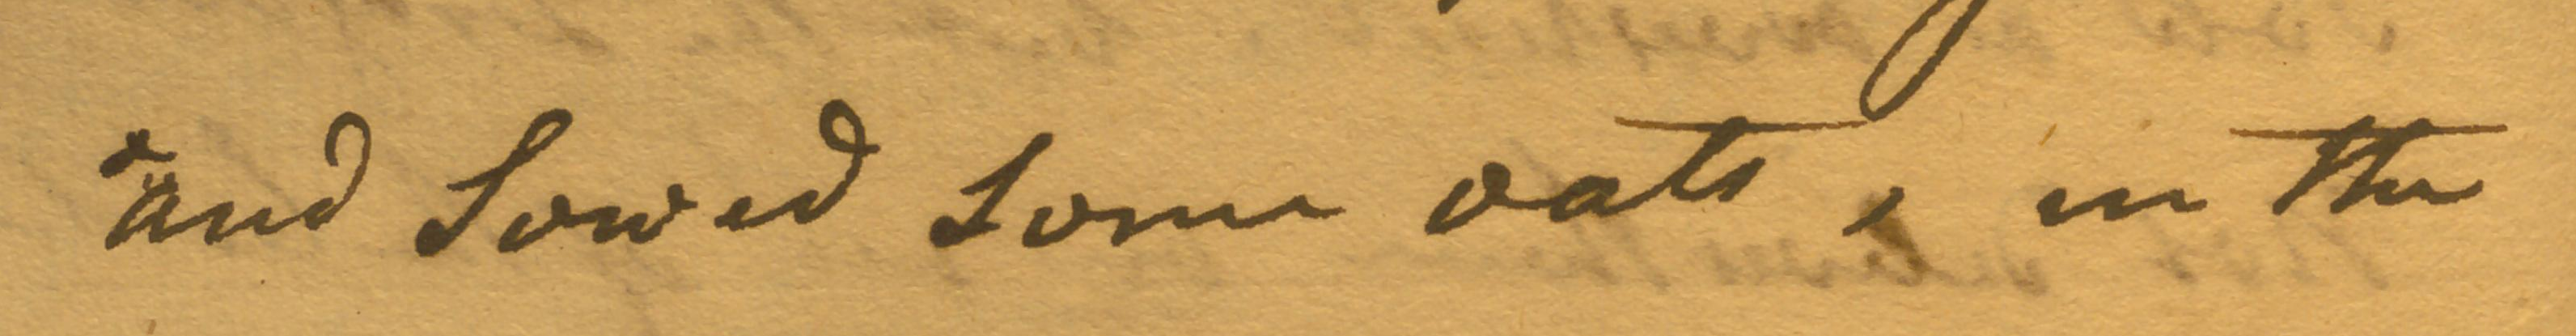and sowed some oats, in the
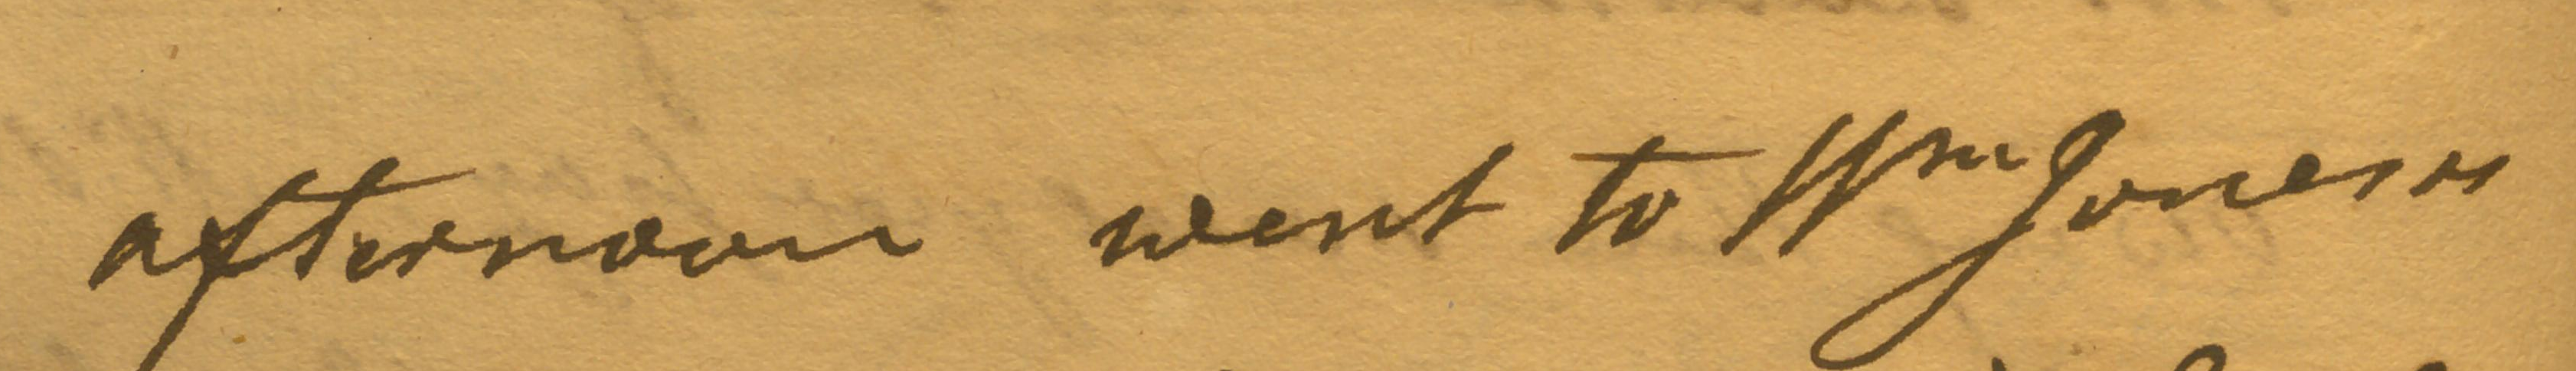afternoon went to W^m Joneses
